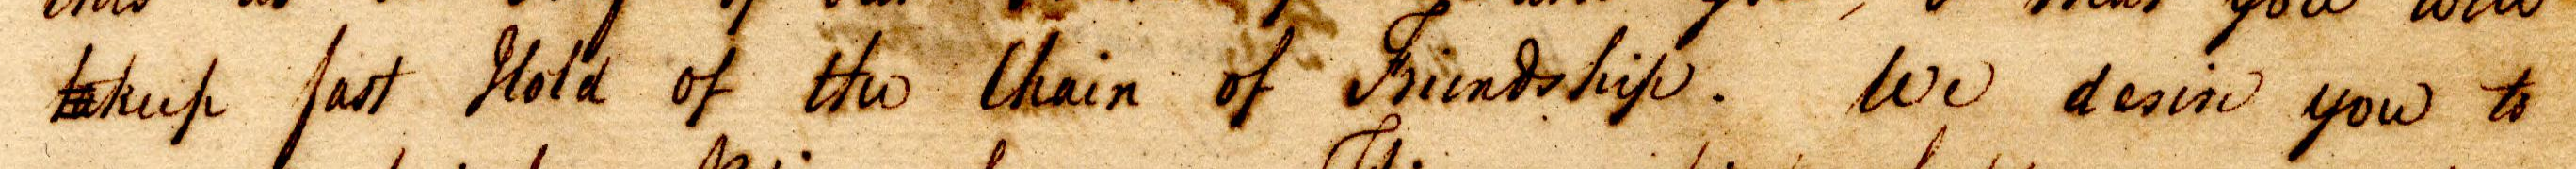keep fast Hold of the Chain of Friendship. We desire you to
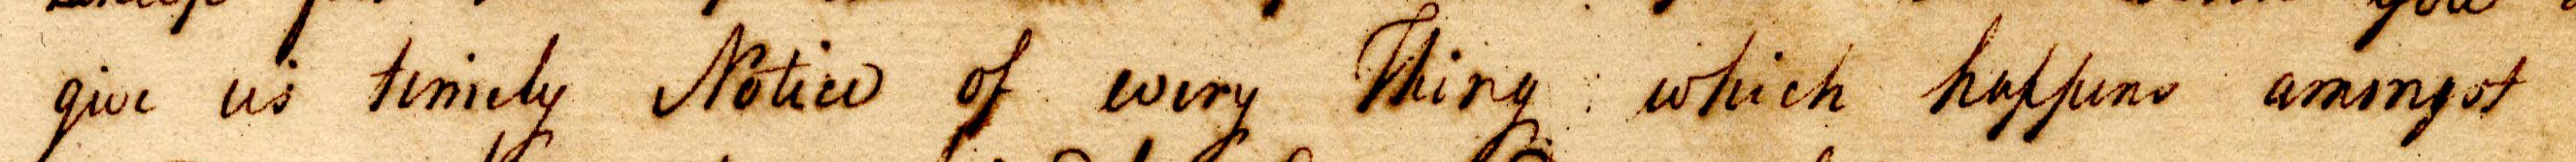give us timely Notice of every Thing which happens amongst
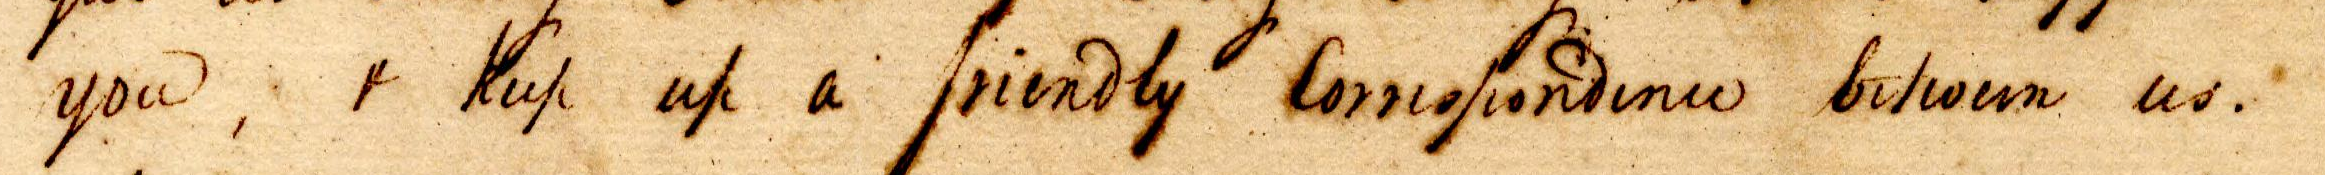you, & Keep up a friendly Correspondence between us.
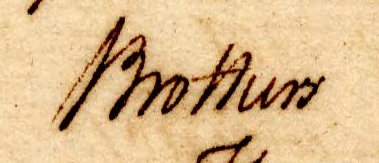Brothers
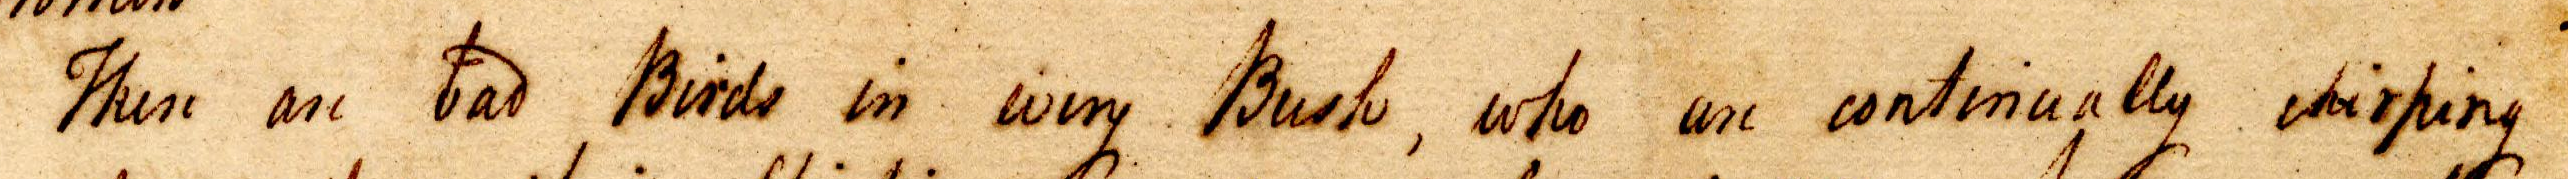There are bad Birds in every Bush, who are continually chirping
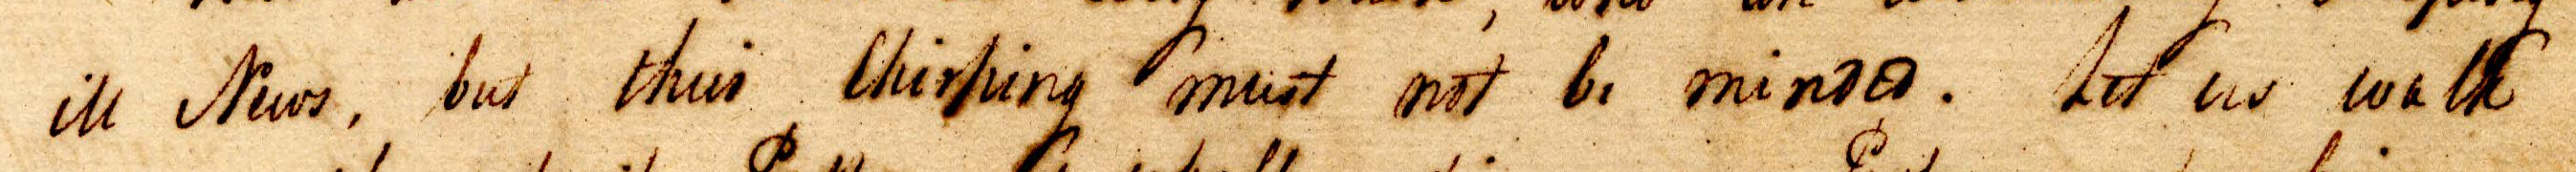ill News, but their Chirping must not be minded. Let us walk
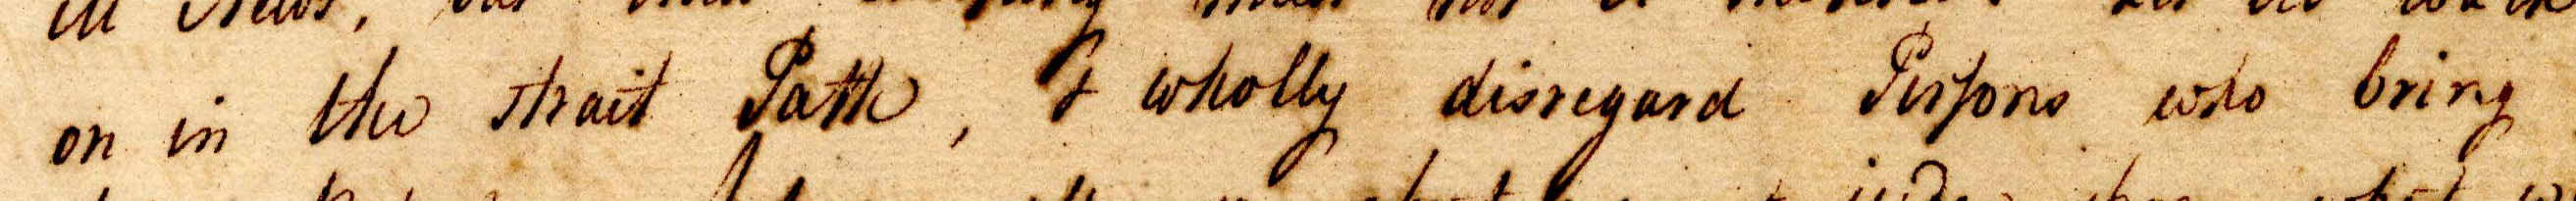on in the strait Path, & wholly disregard Persons who bring
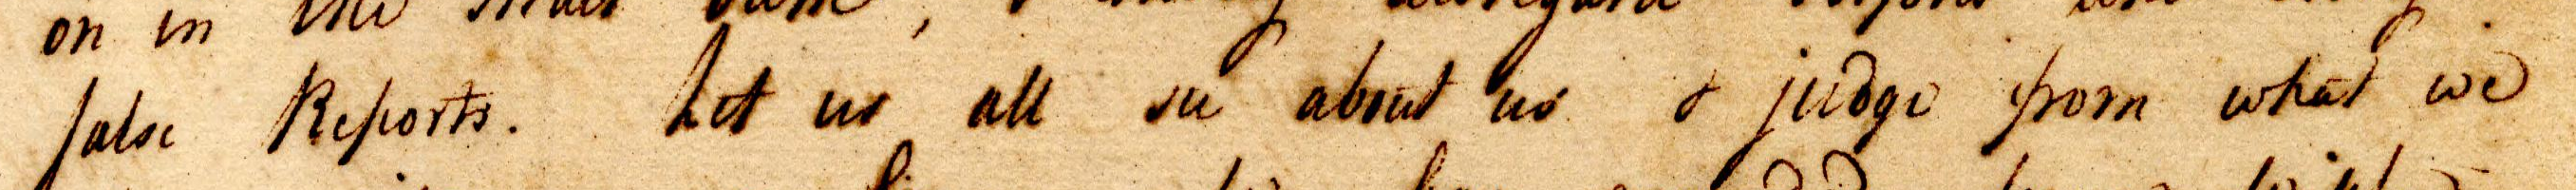false Reports. Let us all see about us & judge from what we
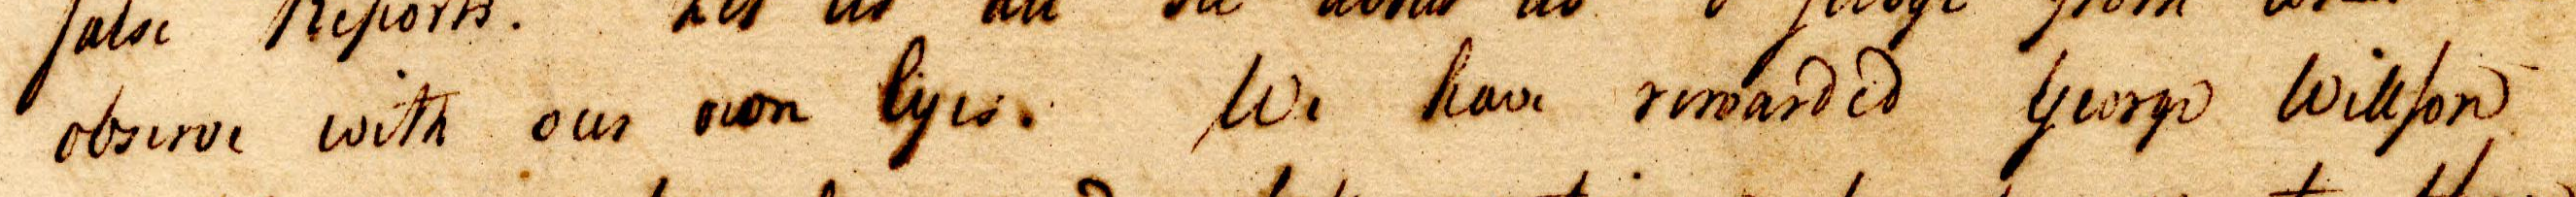observe with our own Eyes. We have rewarded George Willson
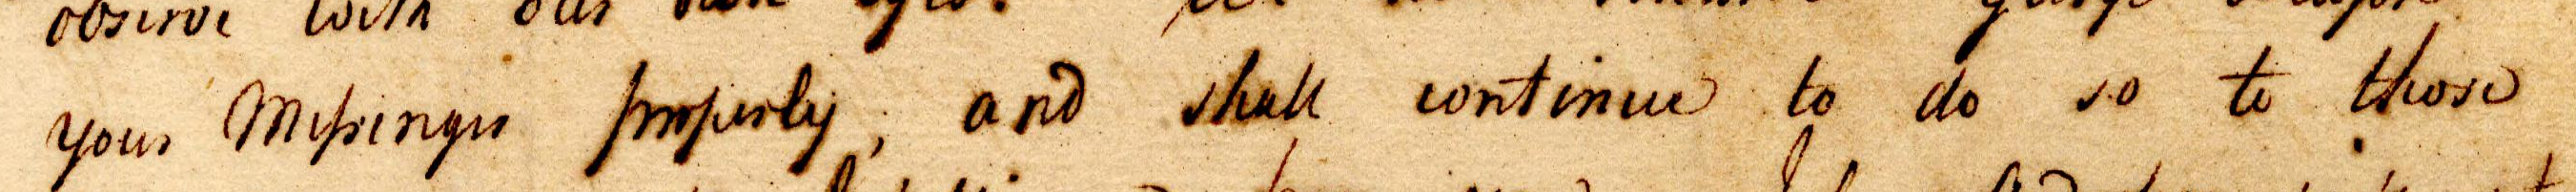your Messages properly; and shall continue to do so to those
